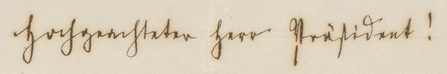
Hochgeachteter Herr Präsident!
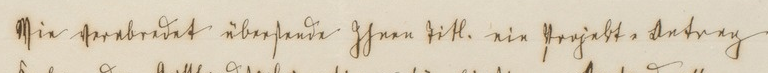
Wie verabredet übersende Ihnen Titl. ein Projekt-Antrag
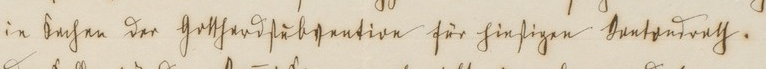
in Sachen der Gotthardsubvention für hiesigen Kantonsrath.
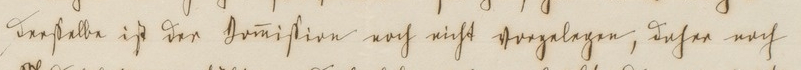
Derselbe ist der Kommission noch nicht vorgelegen, daher noch
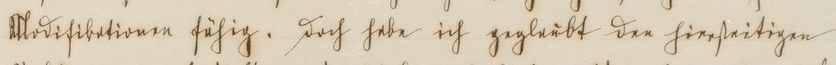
Modifikationen fähig. Doch habe ich geglaubt den hierseitigen
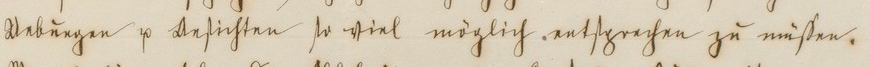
Uebungen & Ansichten so viel möglich entsprechen zu müssen.
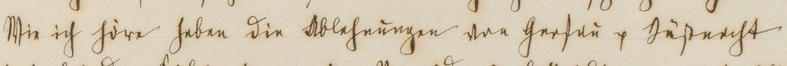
Wie ich höre haben die Ablehnungen von Gersau & Küßnacht
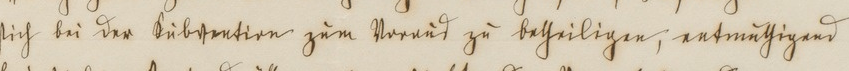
sich bei der Subvention zum Voraus zu betheiligen, entmuthigend
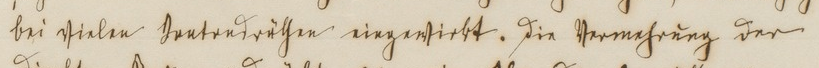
bei vielen Kantonsräthen eingewirkt. Die Vermehrung der
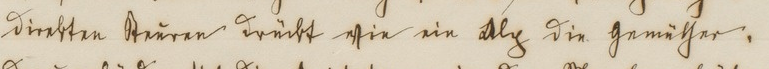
direkten Steuren drückt wie ein Alp die Gemüther.
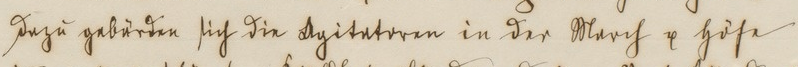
Dazu gebärden sich die Agitatoren in der March & Höfe
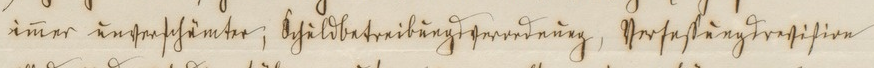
immer unverschämter, Schuldbetreibungsverordnung, Verfassungsrevision
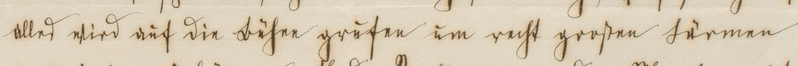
alles wird auf die Bühne grufen um recht großen Lärmen
